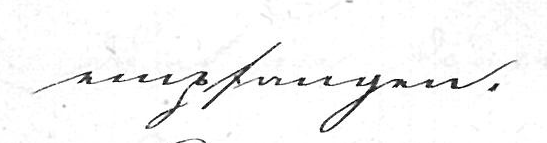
empfangen.
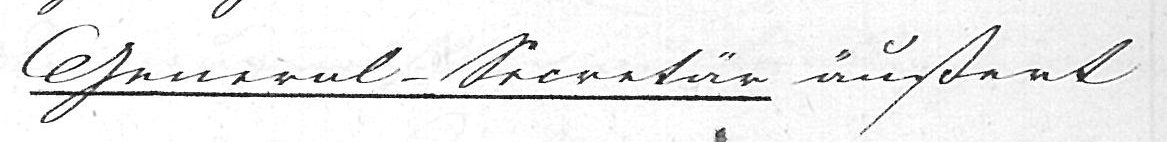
General-Secretär äußert
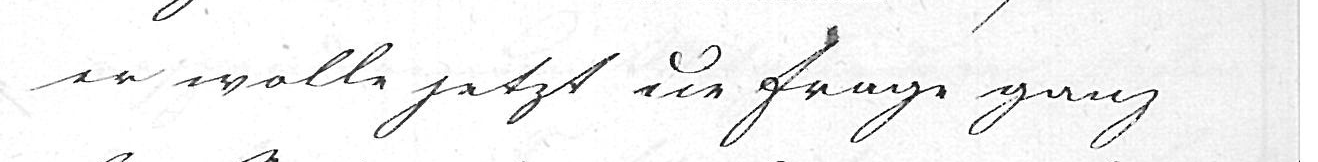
er wolle jetzt die Frage ganz
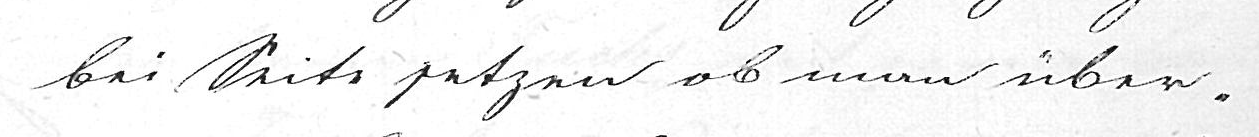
bei Seite setzen ob man über-
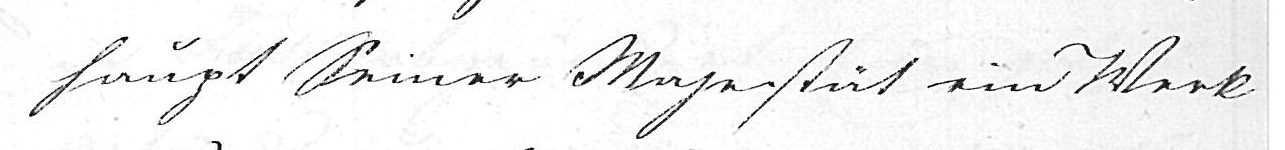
haupt Seiner Majestät ein Werk
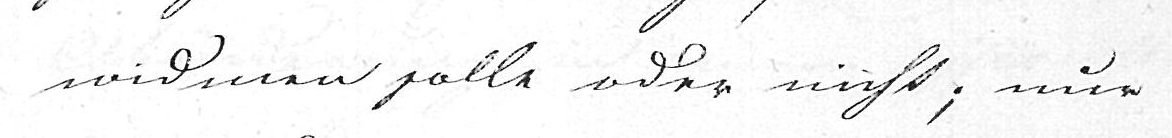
widmen solle oder nicht; nur
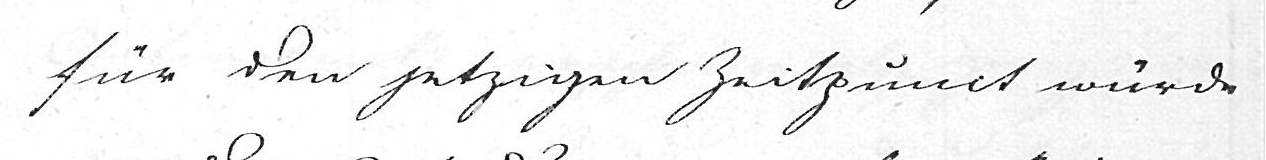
für den jetzigen Zeitpunct würde
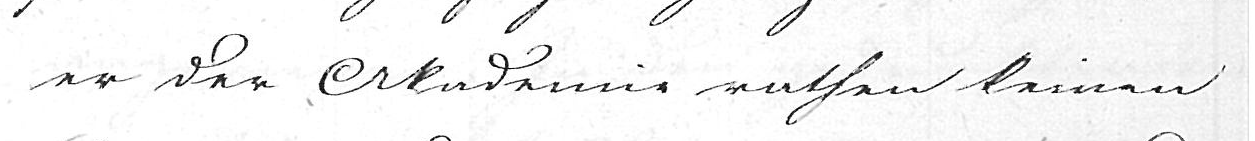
er der Akademie rathen keinen
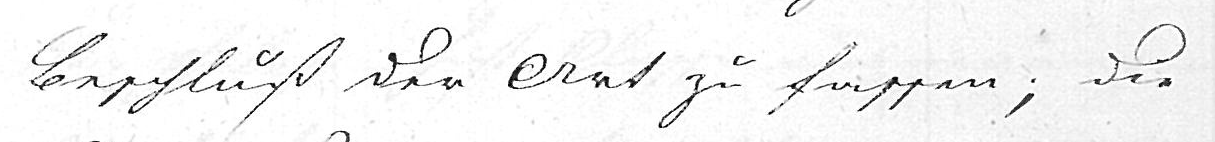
Beschluß der Art zu lassen; die
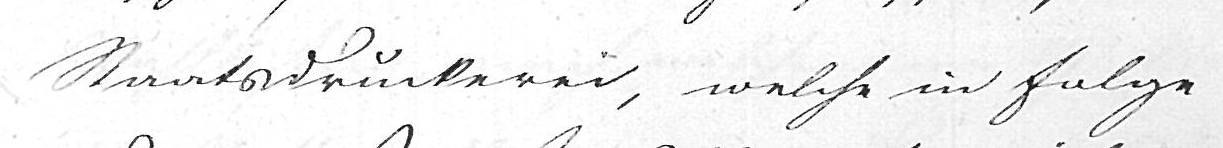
Staatsdruckerei, welche in Folge
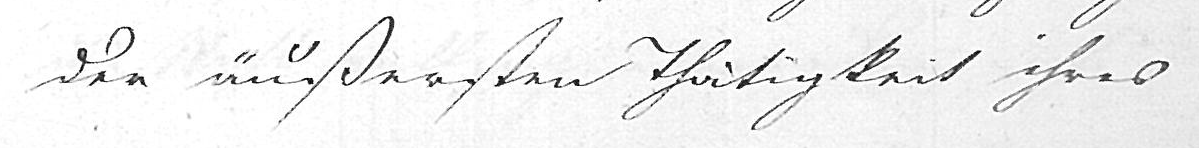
der äußersten Thätigkeit ihres
